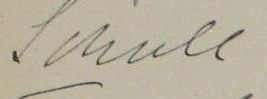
Schule
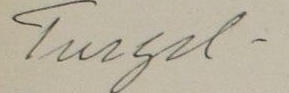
Turgel-
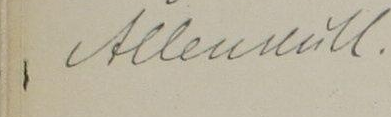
Allenküll
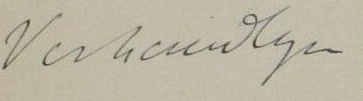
Verhandlgen
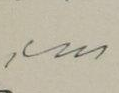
im
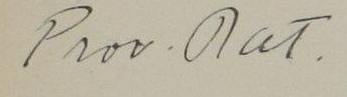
Prov. Rat.
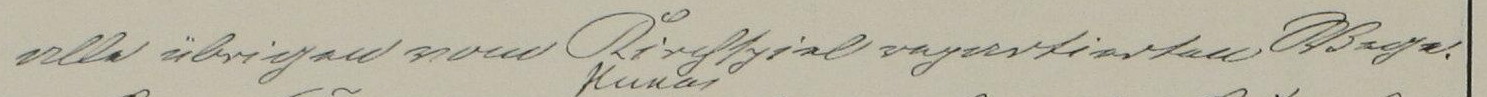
alle übrigen vom Kirchspiel repartierten Wege.
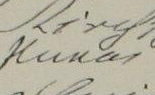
Hukas
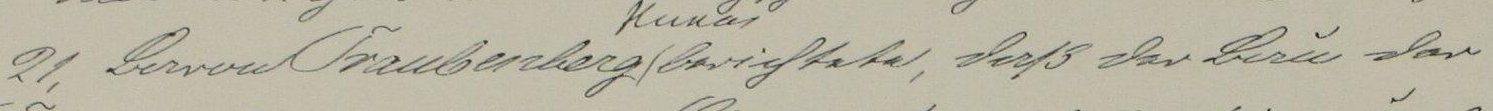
21. Baron Traubenberg berichtete, daß der Bau der
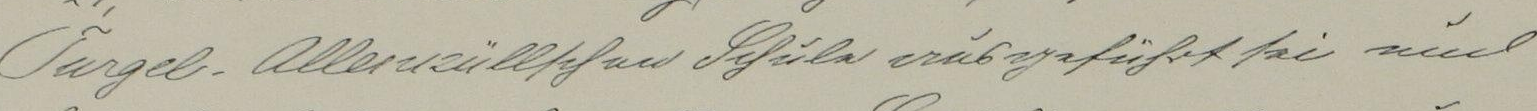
Turgel-Allenküllschen Schule ausgeführt sei und
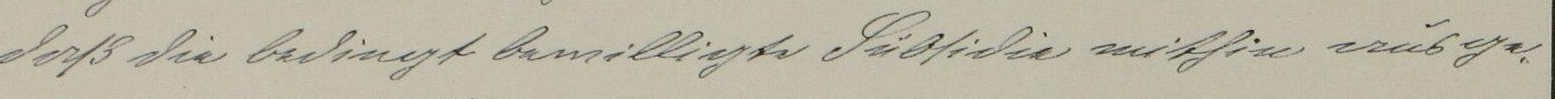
daß die bedingt bewilligte Subsidie mithin ausge-
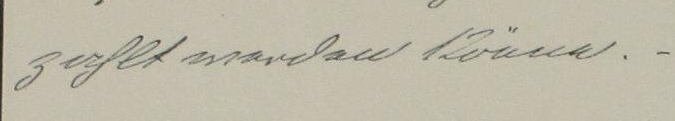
zahlt werden könne.
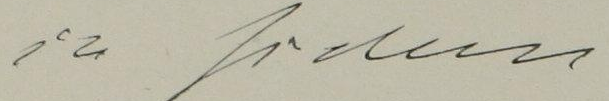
in fidem
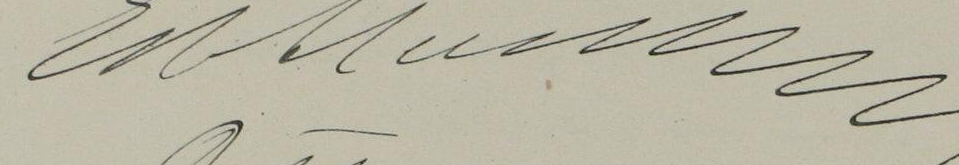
Ed. Stackelberg
